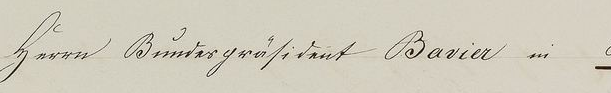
Herrn Bundespräsident Bavier in
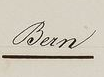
Bern
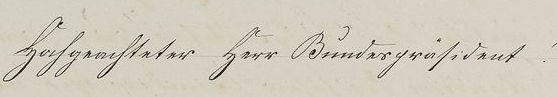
Hochgeachteter Herr Bundespräsident!
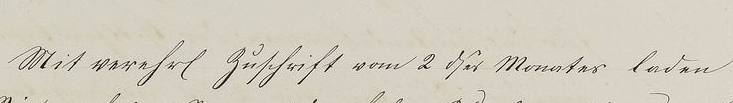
Mit verehrlicher Zuschrift vom 2. dses Monates laden
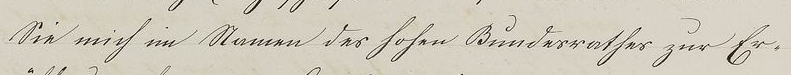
Sie mich im Namen des hohen Bundesrathes zur Er-
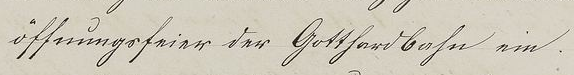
öffnungsfeier der Gotthardbahn ein.
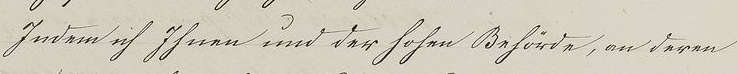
Indem ich Ihnen und der hohen Behörde, an deren
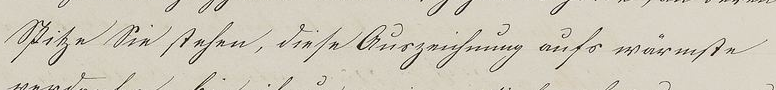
Spitze Sie stehen, diese Auszeichnung aufs wärmste
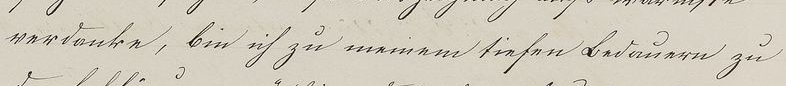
verdanke, bin ich zu meinem tiefen Bedauern zu
